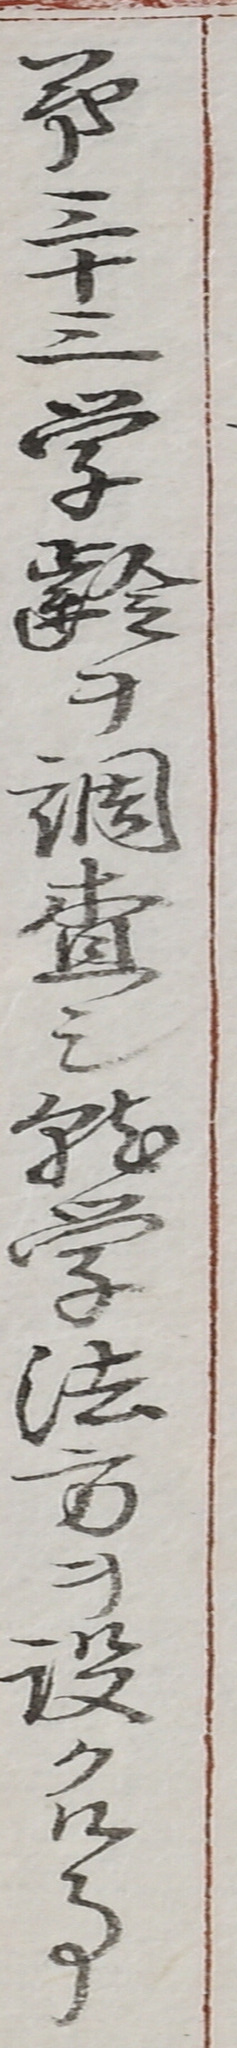第三十三学齢ヲ調査シ就学法方ヲ設クル事
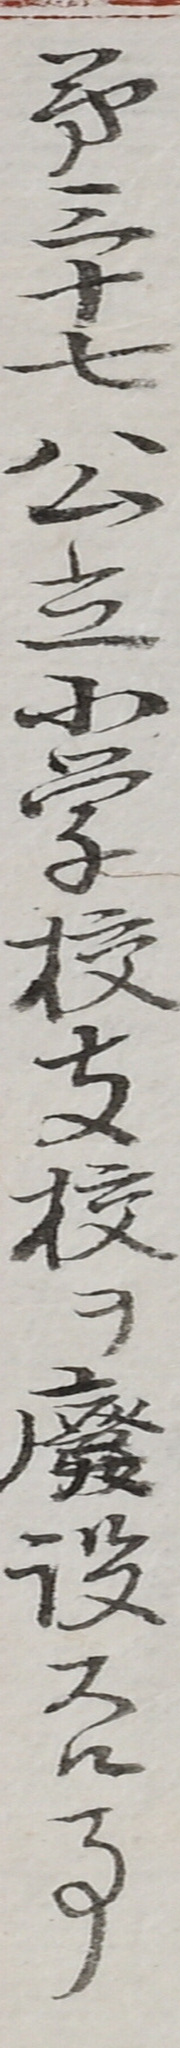第三十七公立小学校支校ヲ廃設スル事
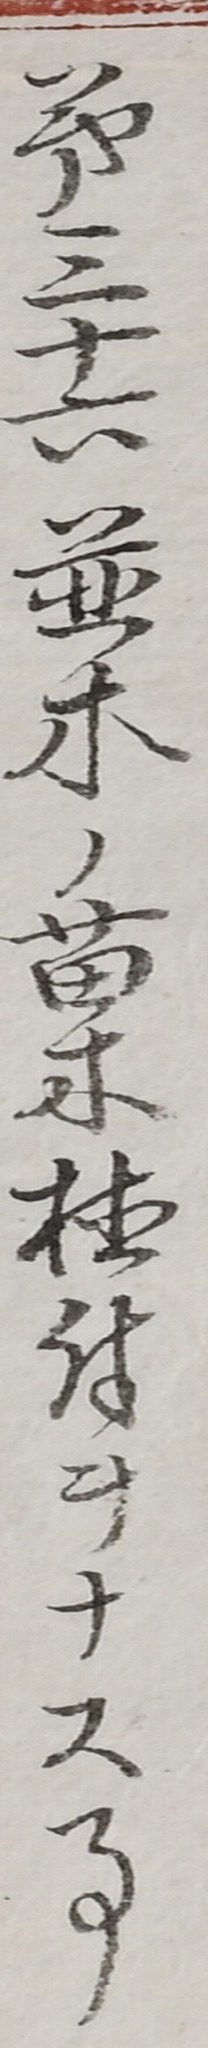第三十六並木ノ苗木植付ヲナス事
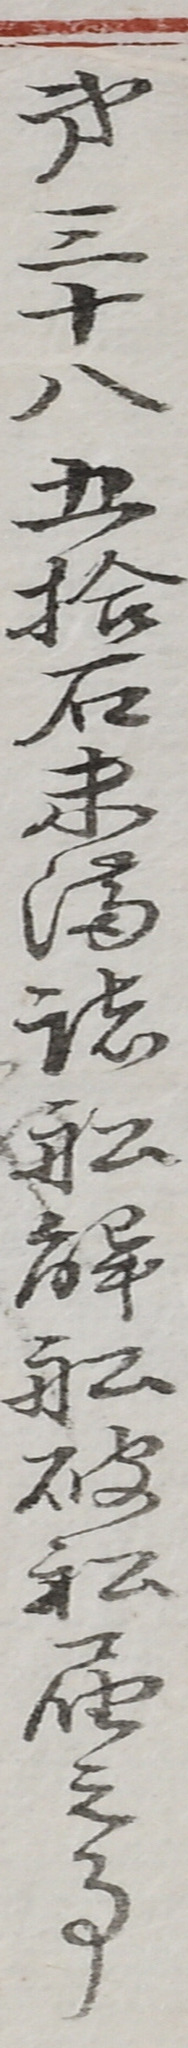第三十八五拾石未満諸船解船破船届之事
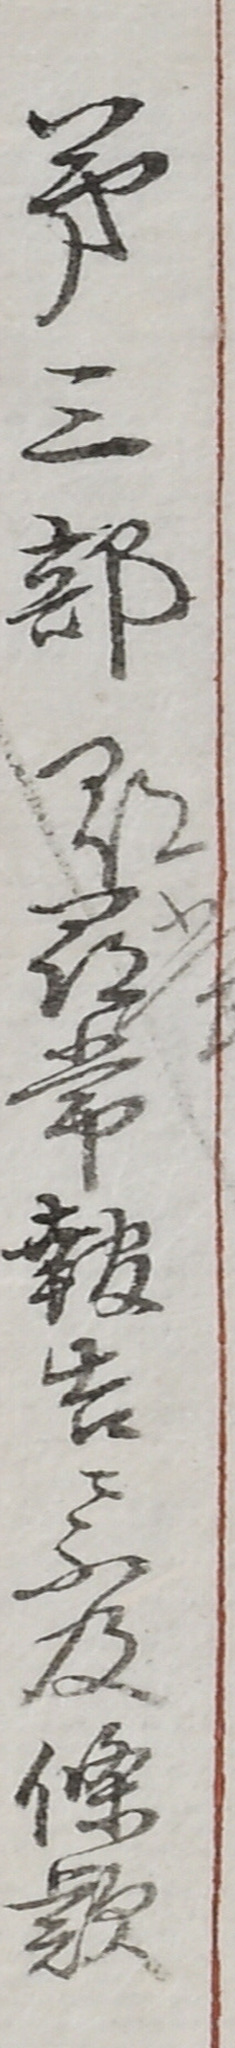第三部尋常報告に不及條款
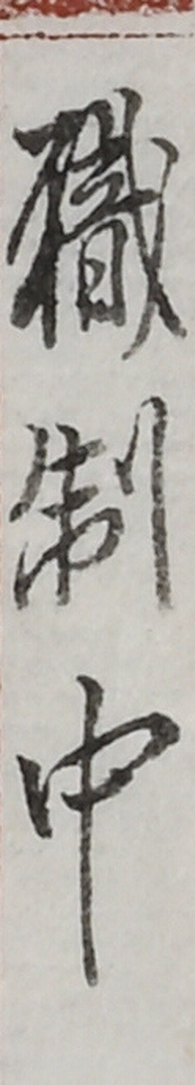職制中
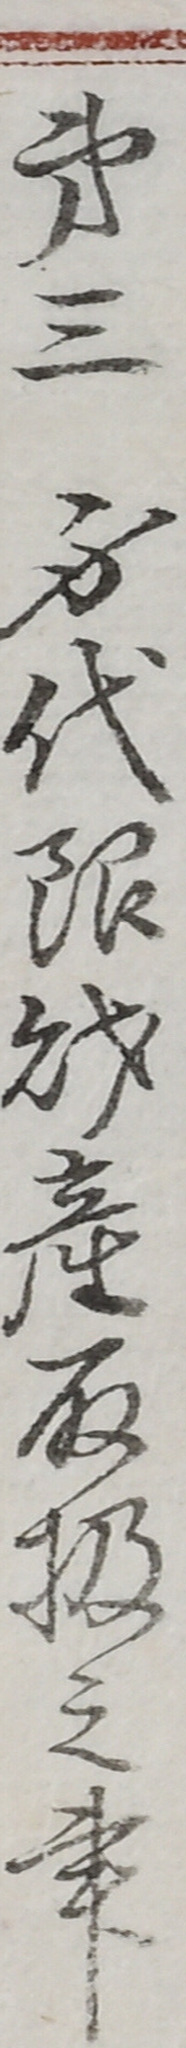第三身代限財産取扱之事
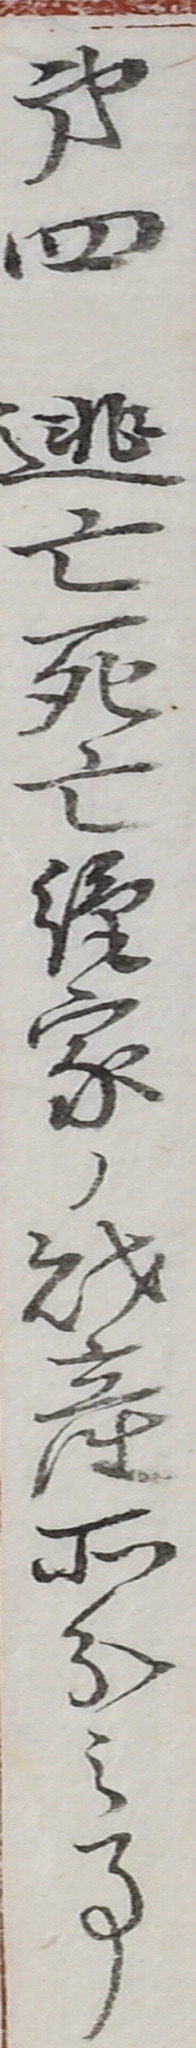第四逃亡死亡僧家ノ財産所分之事

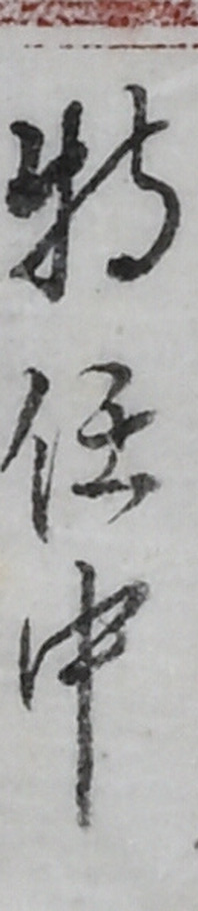特任中
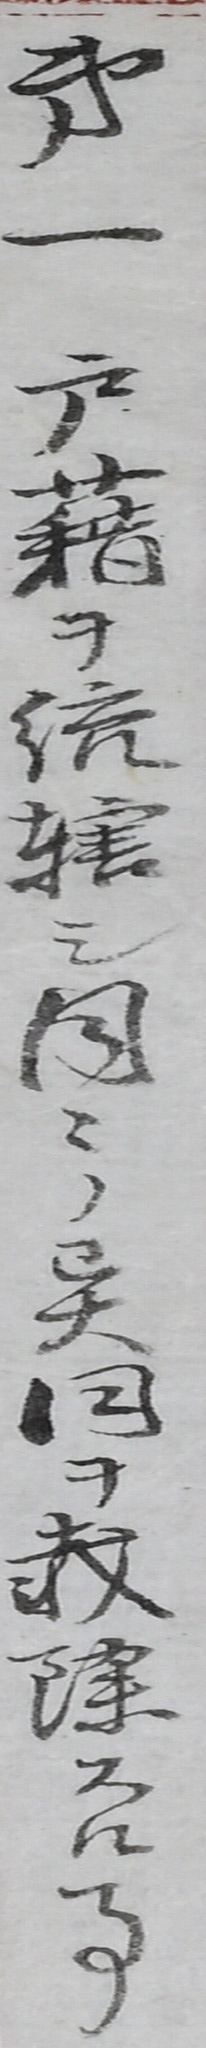第一戸籍ヲ統轄シ月々ノ異同ヲ救除スル事
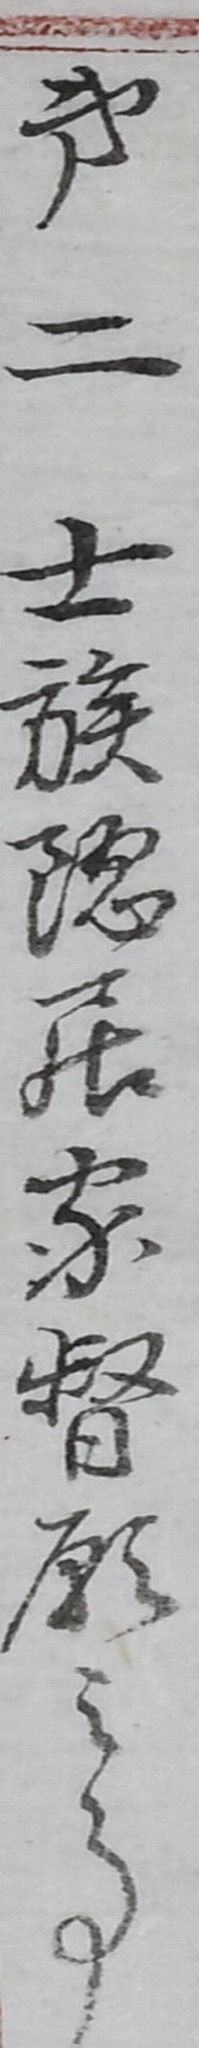第二士族隠居家督願之事
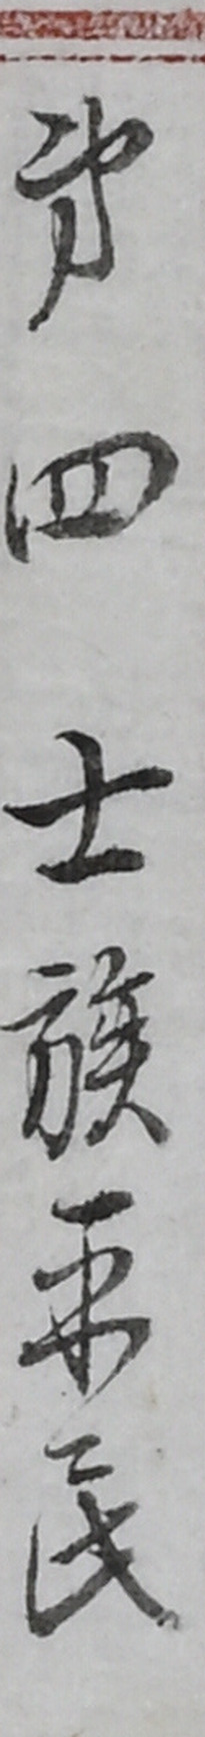第四士族平民
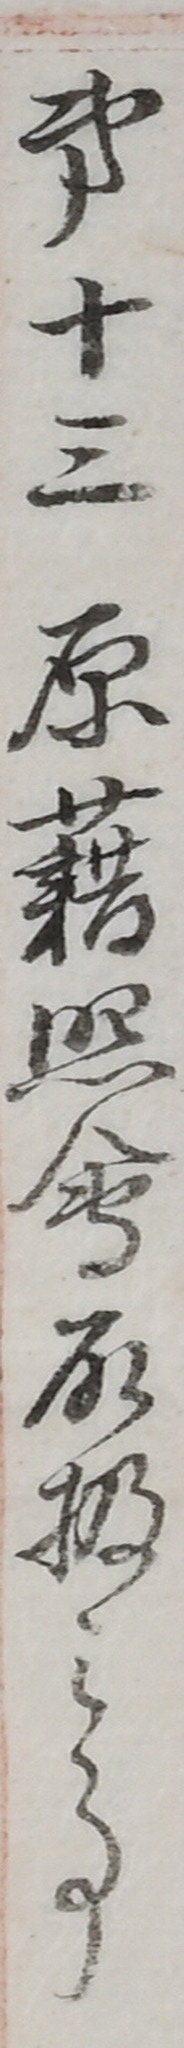第十三原籍照会取扱之事
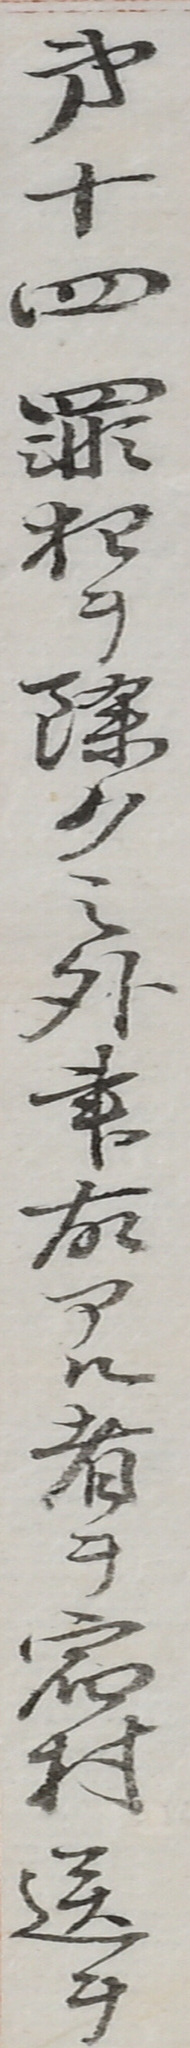第十四罪把ヲ除ク之外右アル者ヲ宿村送ヲ
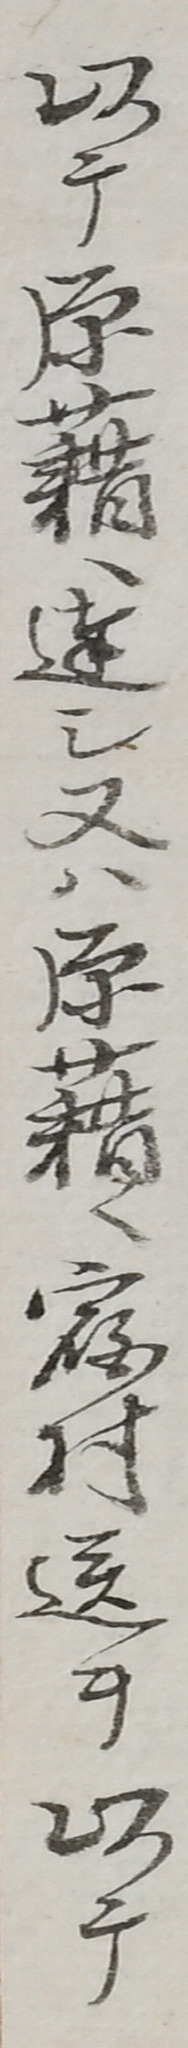以テ原籍へ達シ又ハ原藉へ宿村送ヲ以テ
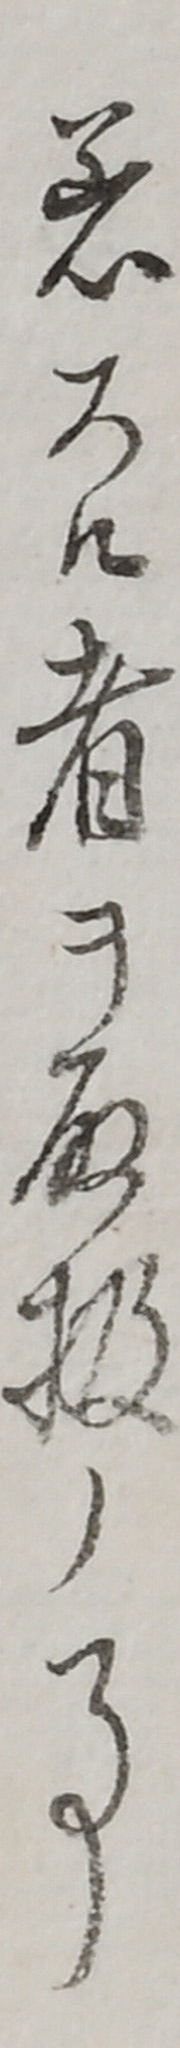着スル者ヲ取扱ノ事
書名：郡役所勤務中御用抜書
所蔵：伊那市立高遠町図書館・合同会社AMANE
